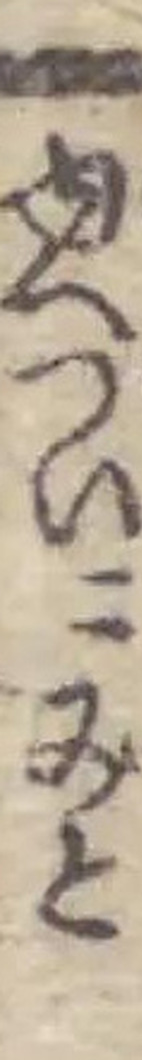ゆへついにみと
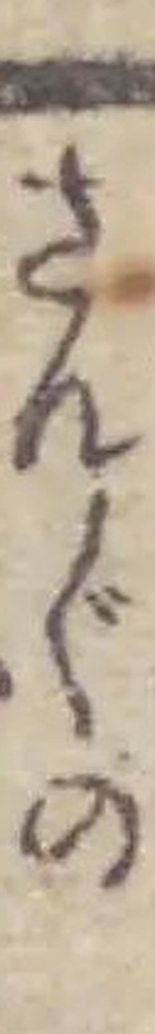さん〴〵の
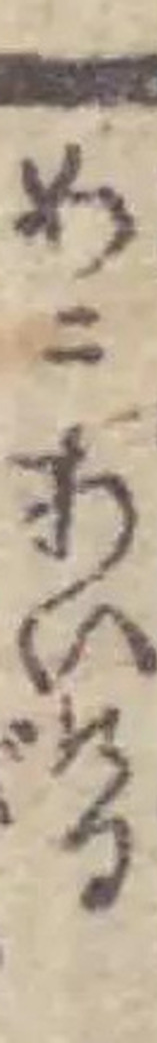めにあいける
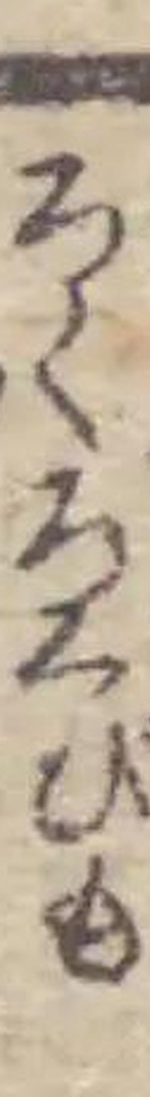ろくろくびも
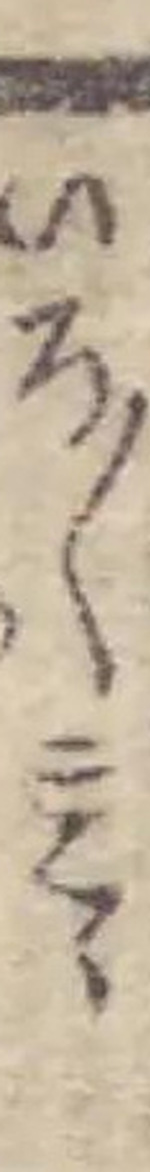いろ〳〵にこゝ
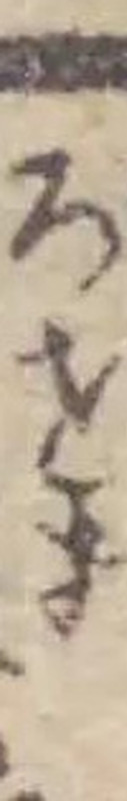ろをあ

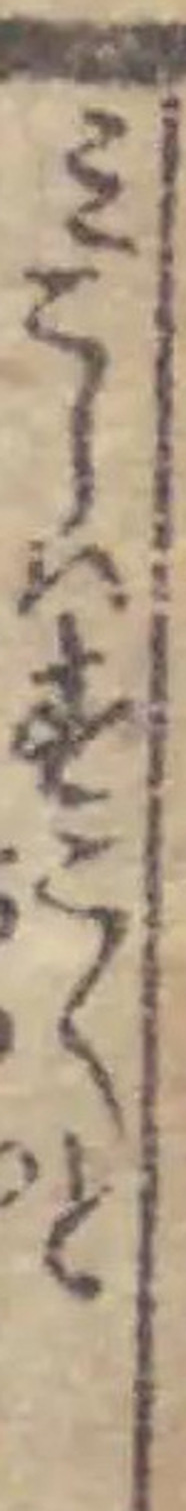みこしはすこ〳〵と
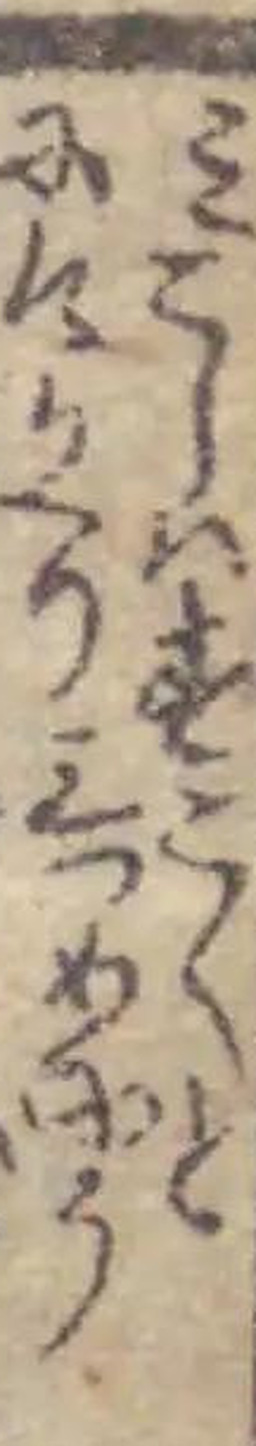にけかへり三つめにう
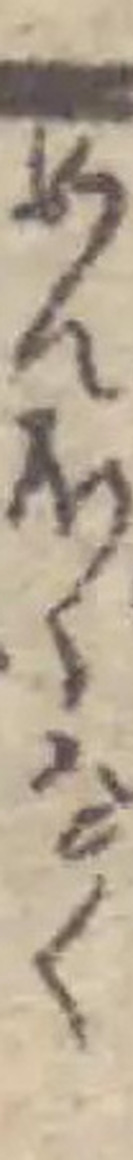めんほくなく
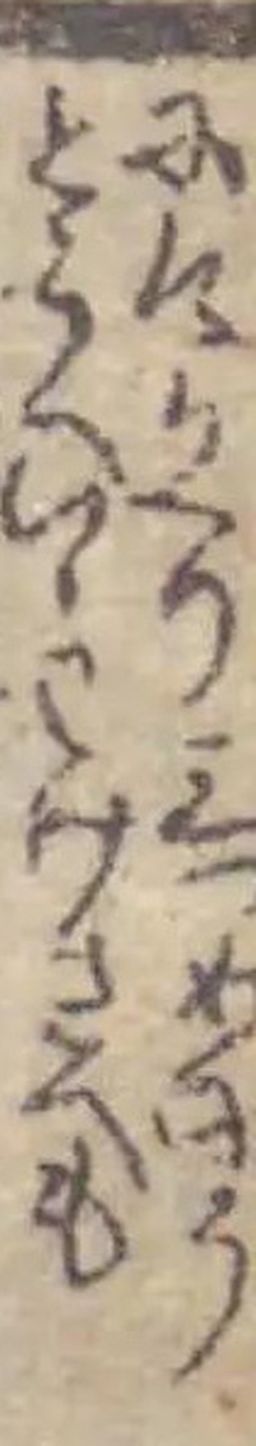とうへいゝわけさへも
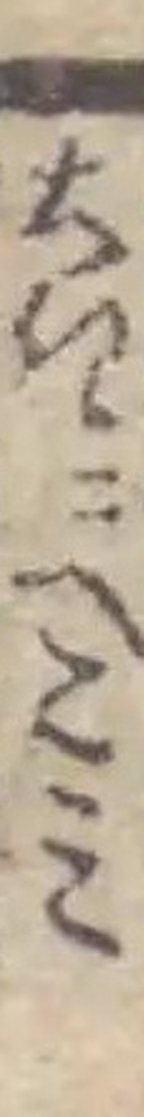大いにへこみ
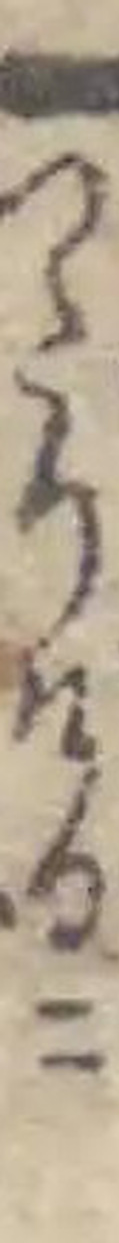いたりけるに
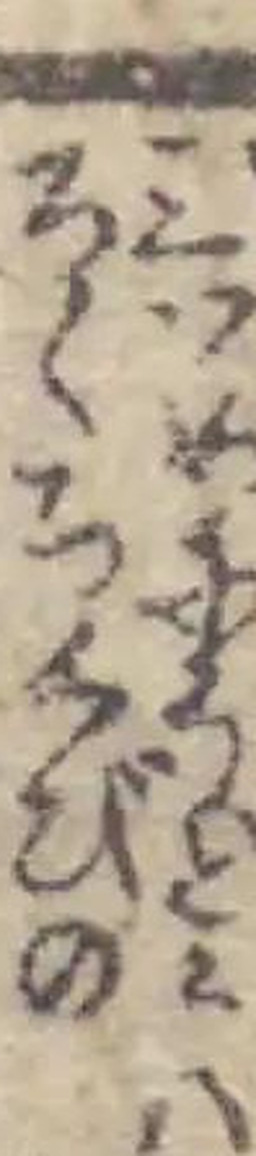ろくろくびの
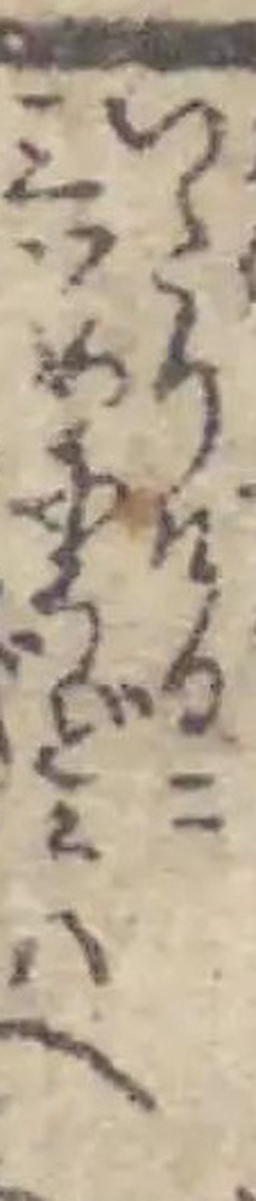三つめにうどうは
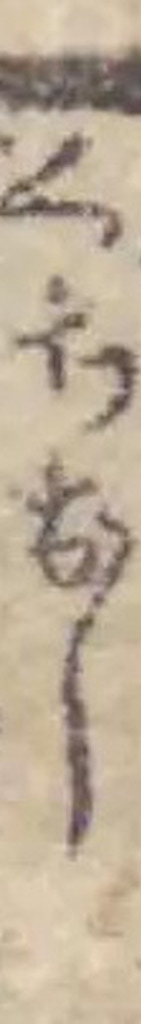くちおし
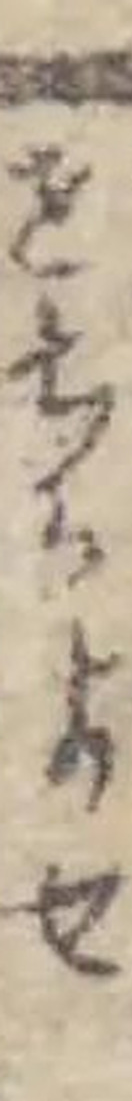をちかよせ
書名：化物尽 4巻
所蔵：国立国会図書館 National Diet Library, JAPAN
